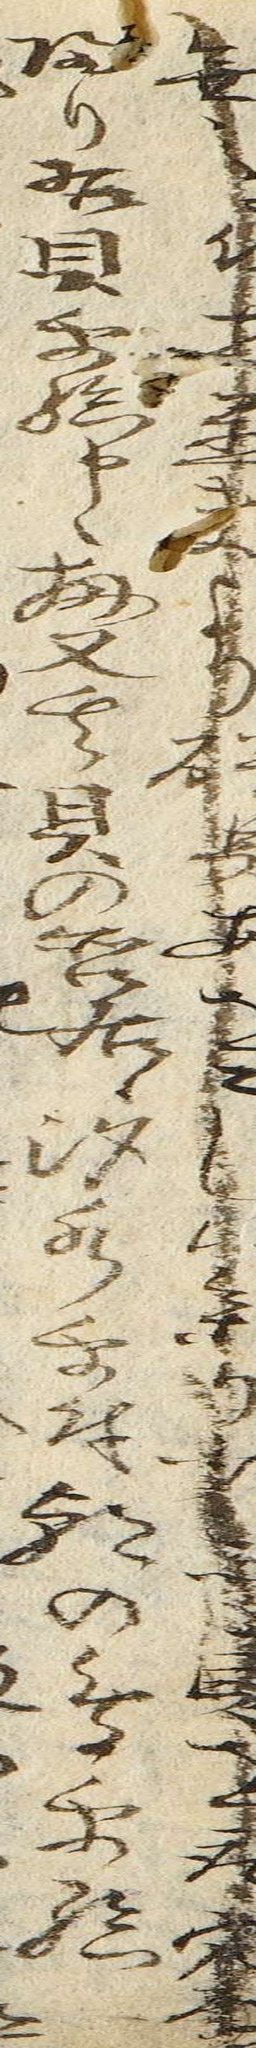帰り右貝を給申候扨又其貝の含居候汐水を付朝の鳥を給
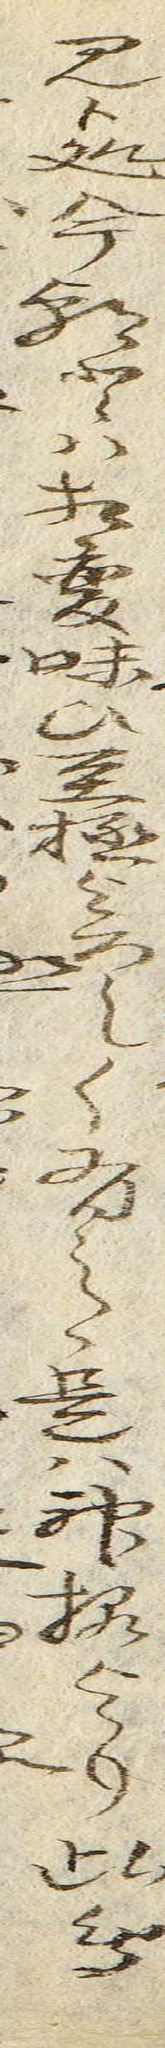見候処今朝とハ相変味ひ至極よろしく有之候是ハ神様より此鳥
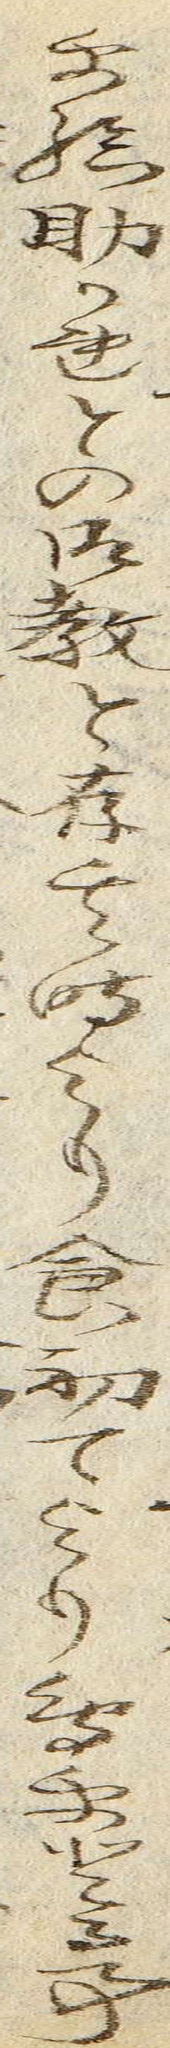を給助かれとの御教と存其時より食初てより鳥をとる事
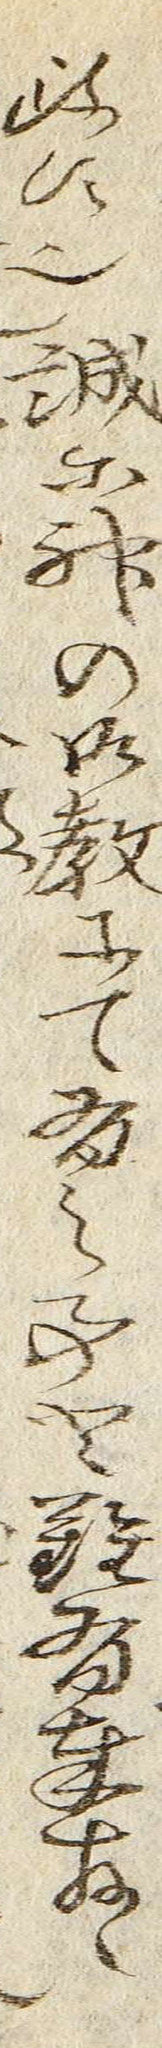致す也誠に神の御教にて有之事と難有奉存候
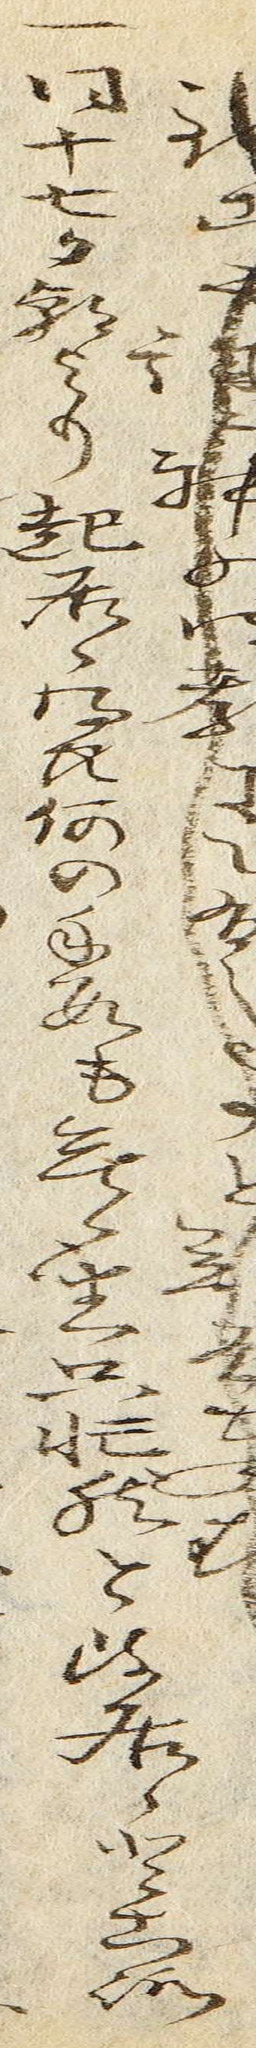一同十七日朝より起居候得共何の手段も無御座只忙然と致居候ところ
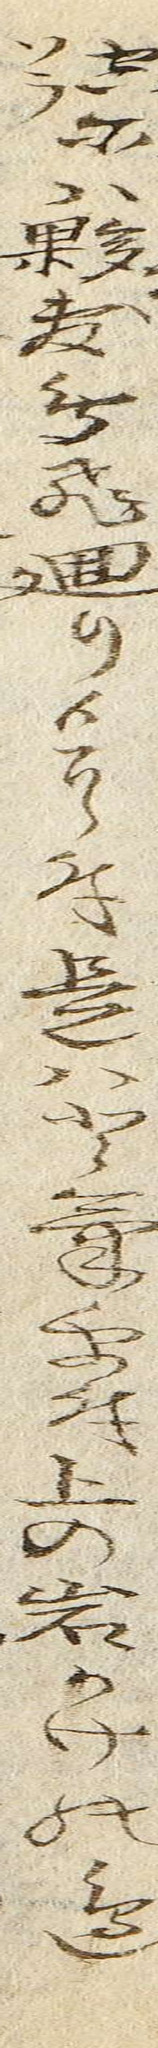空にハ夥敷鳥飛廻り候に付是ハと気を付上の岩かけの辺
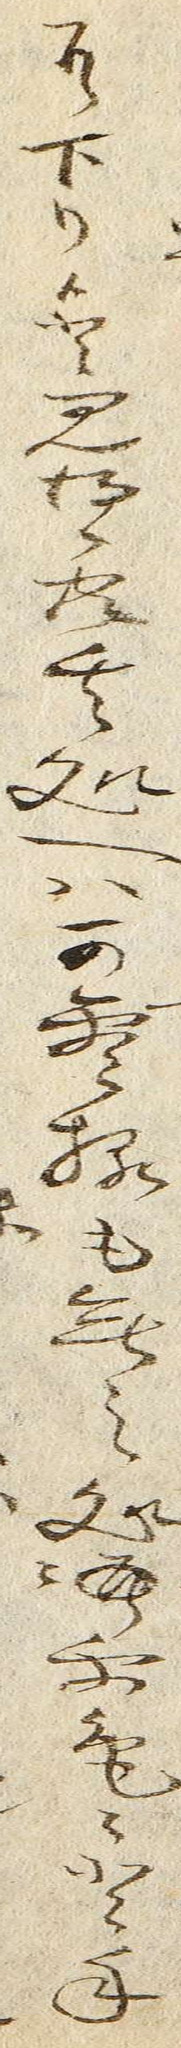に下り候と見得候共其処ヘハ可参様も無之処々を色々と手
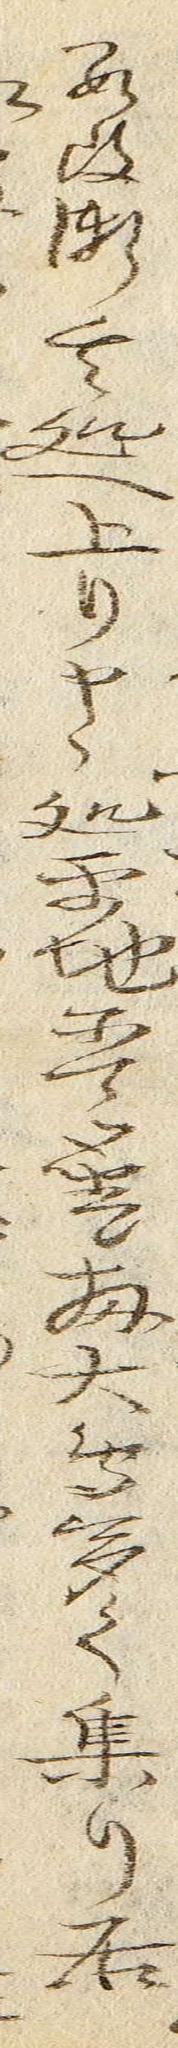段致漸其処へ上り申候処平地にて御座候扨大鳥多く集り居
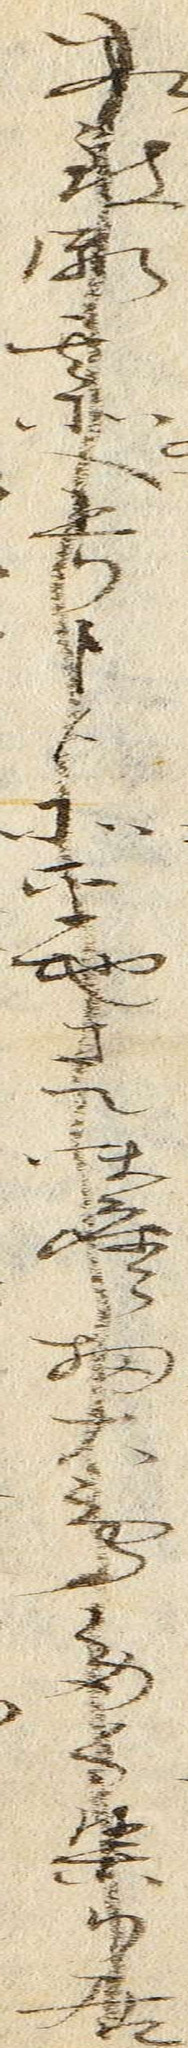段致漸其処へ上り申候処平地にて御座候扨大鳥多く集り居
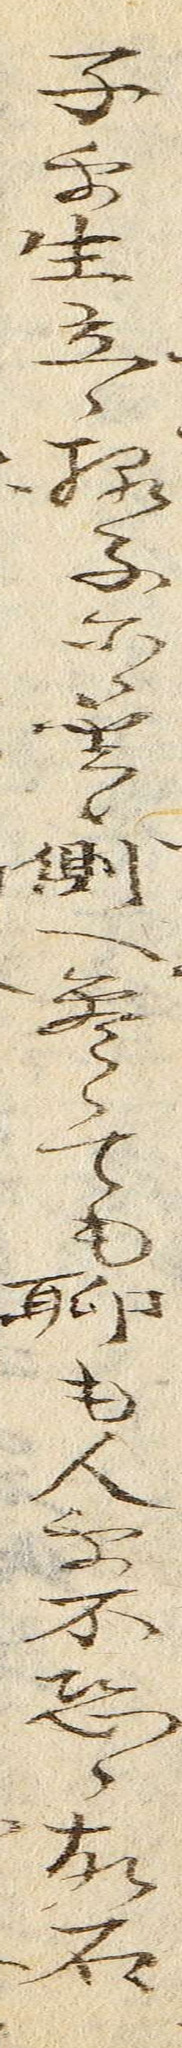子を生立候様子に御座候側へ参候ても聊も人を不恐候故石
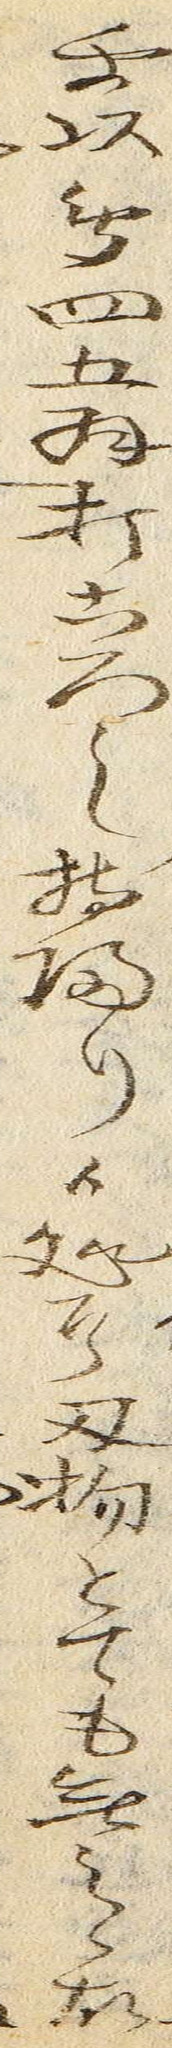を以鳥四五羽打ころし持帰り候処に刃物とても無之候故
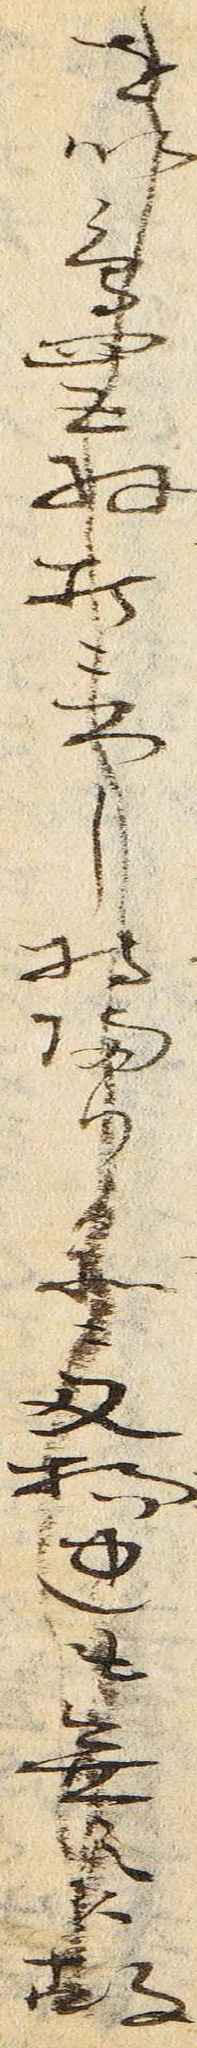を以鳥四五羽打ころし持帰り候処に刃物とても無之候故
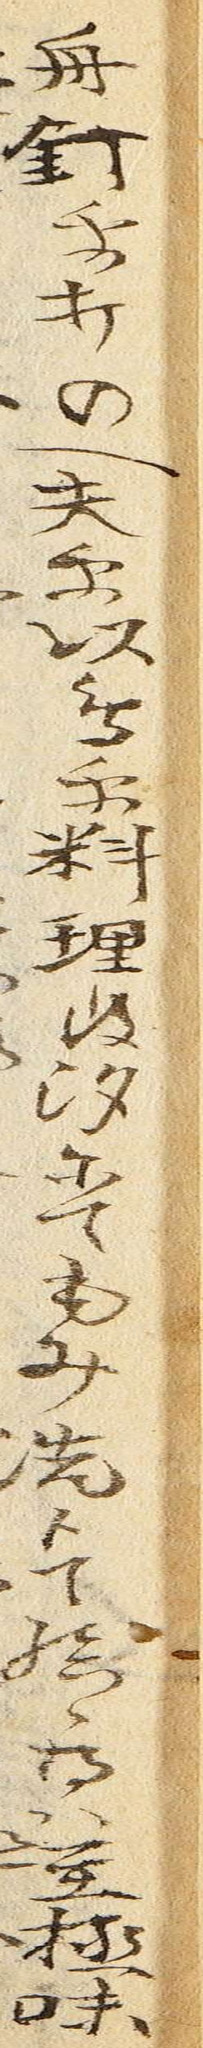舟釘を打のへ夫を以鳥を料理致汐にてもみ洗候て給候得ハ至極味
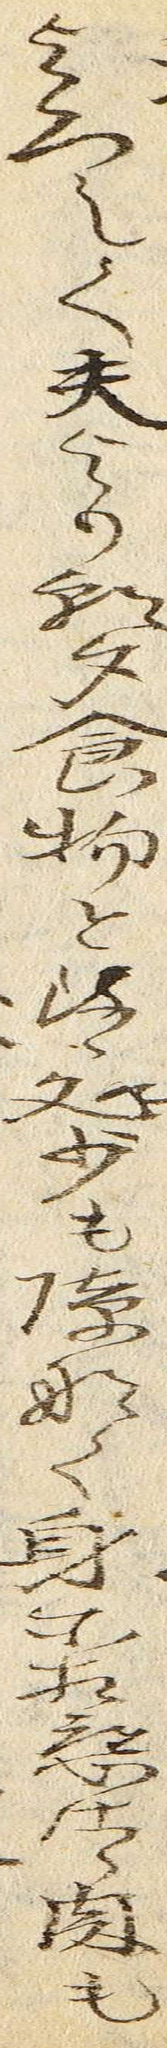よろしく夫より朝夕食物と致候処少も障なく身に相応仕候肉も
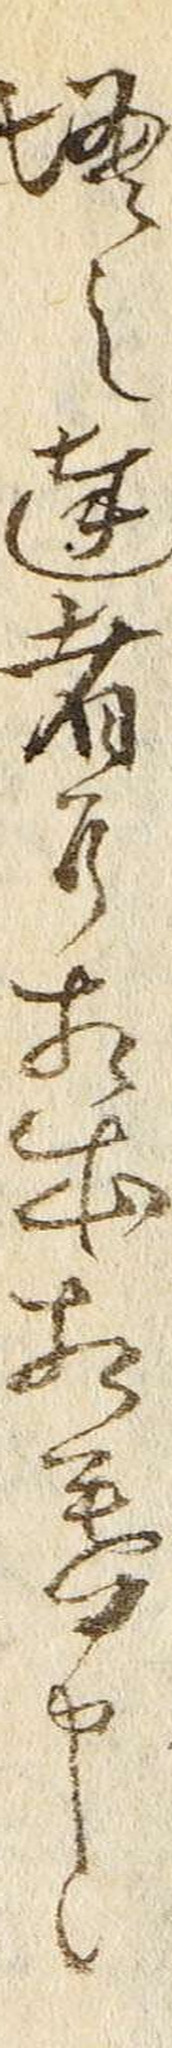増し達者に相成相暮申候
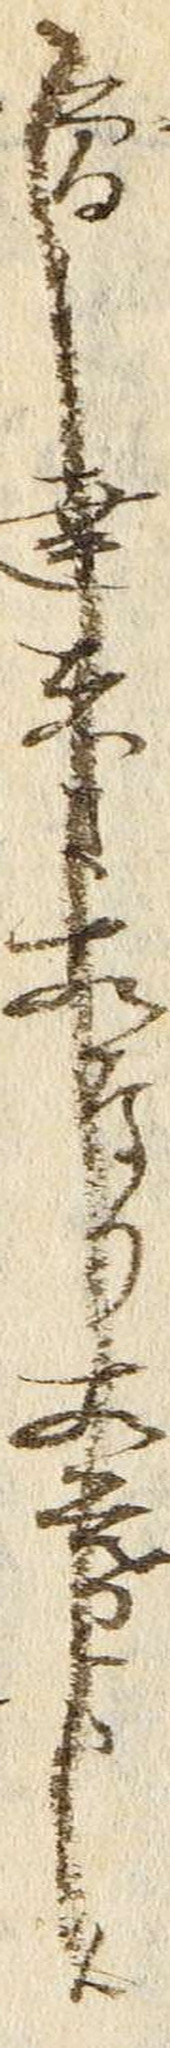増し達者に相成相暮申候
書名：無人島漂流書付
